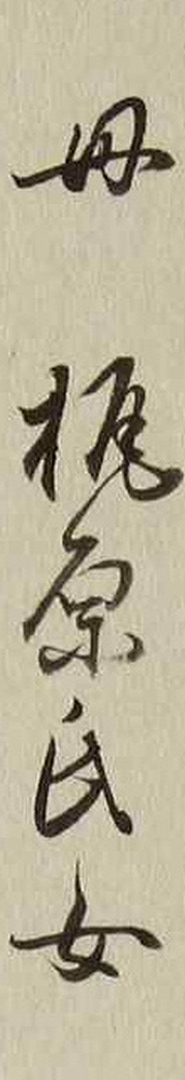母梶原氏女
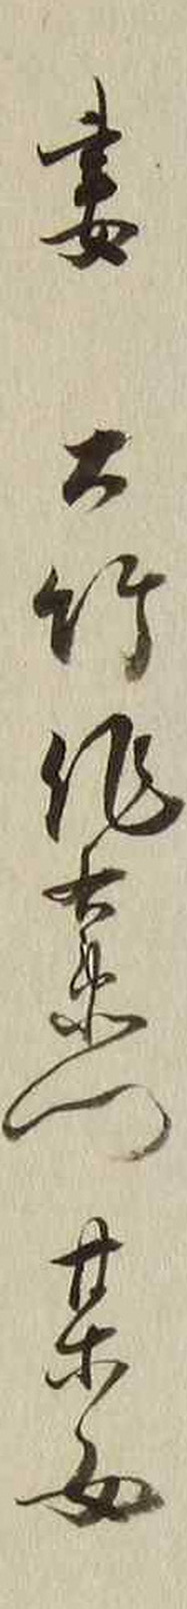妻大竹作右衛門某女
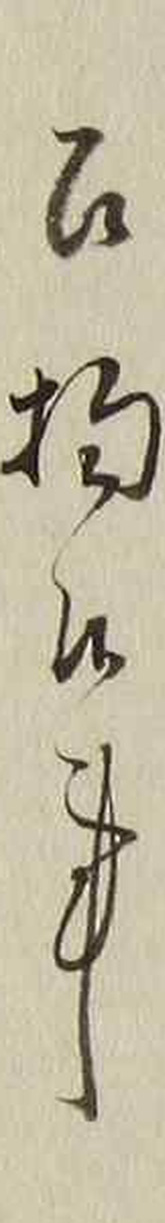召抜候事
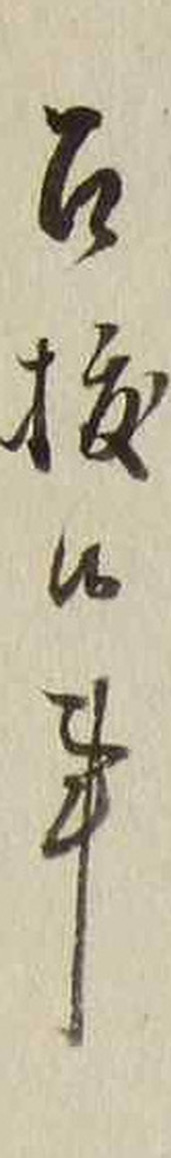召抜候事
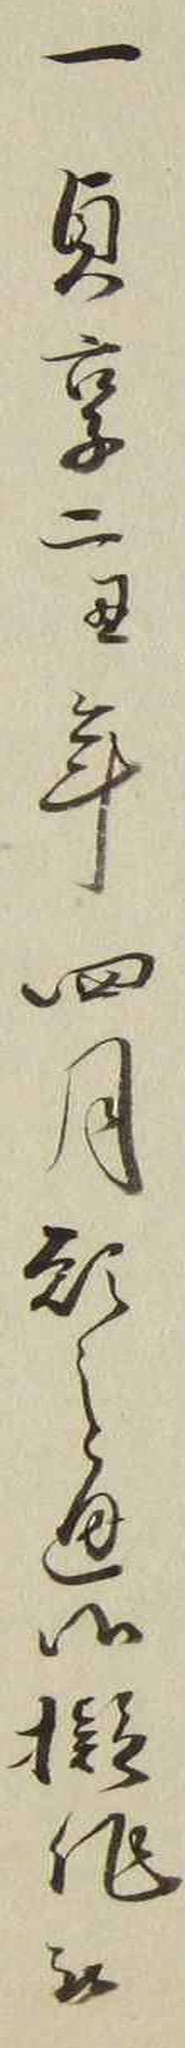一貞享二丑年四月願之通御擬作被

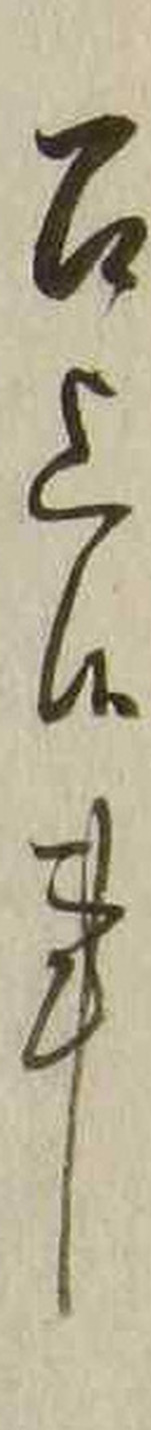召上候事
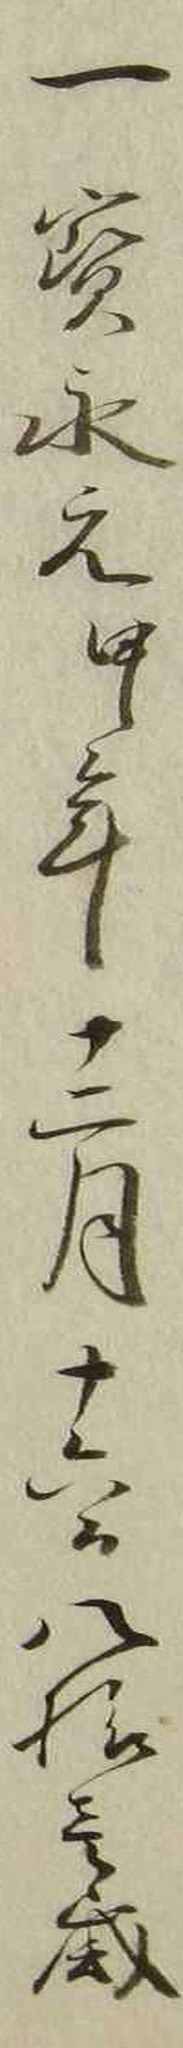一宝永元申年十二月十六日八拾壱歳
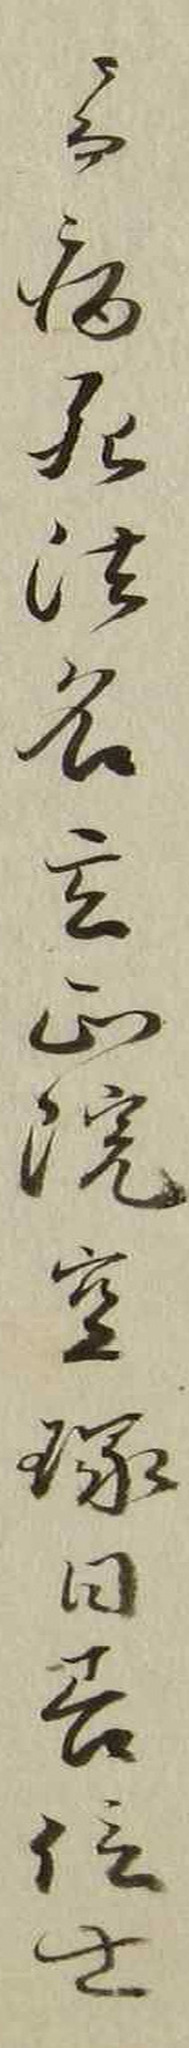ニ而病死法名玄正院空琢日善信士
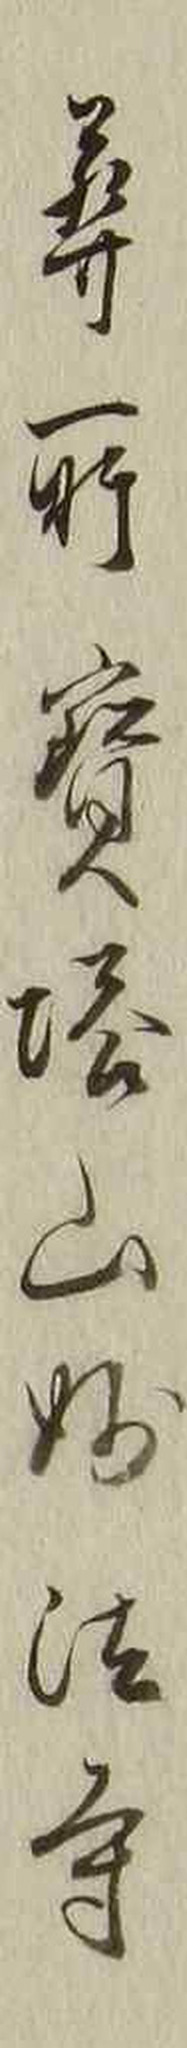葬所宝塔山妙法寺
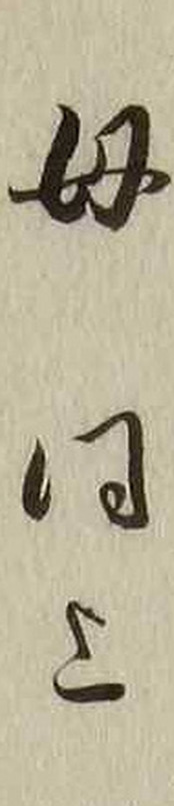母同上
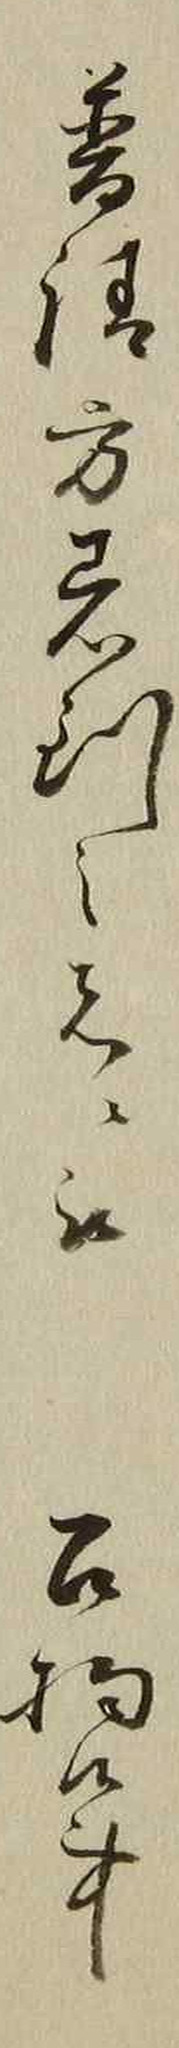普請方着到之者ニ被召抱候事
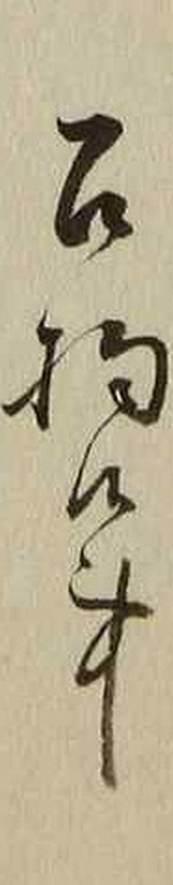召上候事
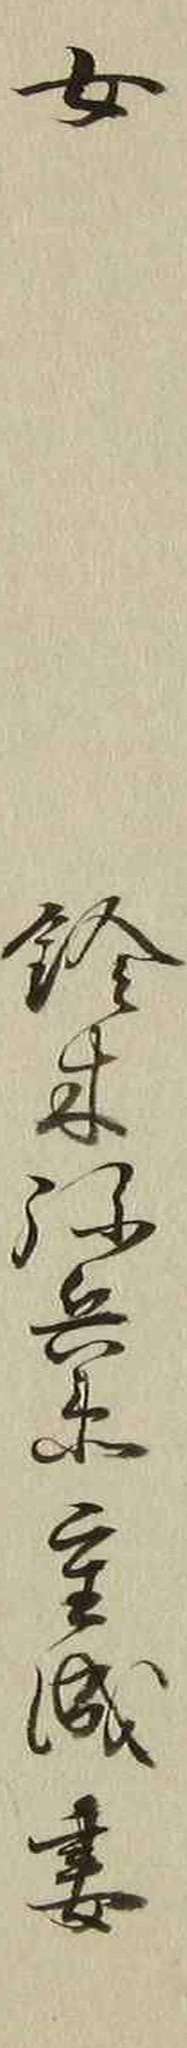女鈴木弥兵衛重成妻
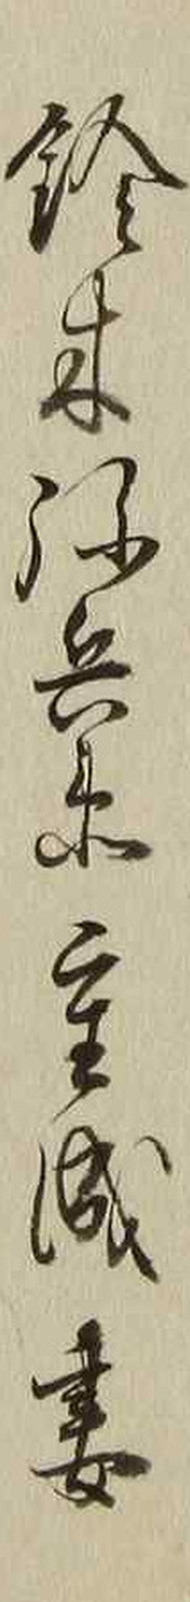女鈴木弥兵衛重成妻
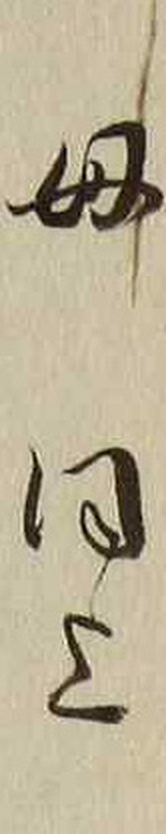母同上
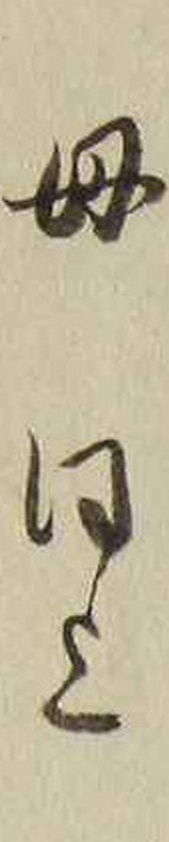母同上
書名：諸士系譜　巻之52　に之部3
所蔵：会津若松市立会津図書館
